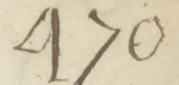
470
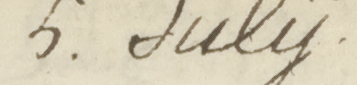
5. Julij.
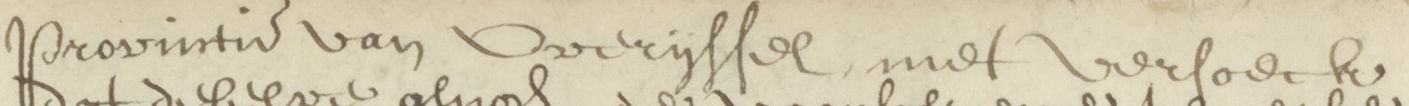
Provintie van Overijssel, met versoeck
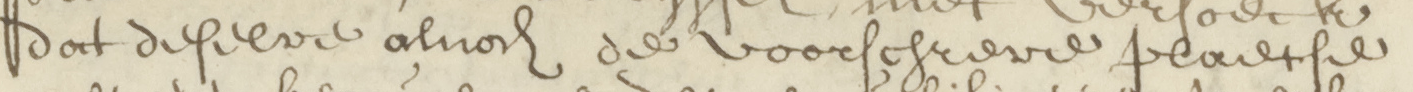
dat deselve alnoch de voorschreve plaetse
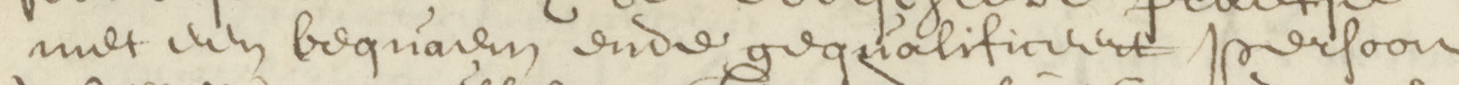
met een bequaem ende gequalificeert persoon
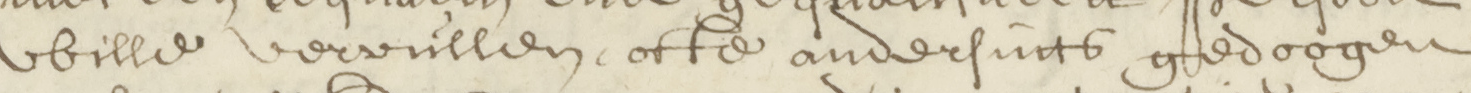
wille vervullen, ofte andersints gedoogen
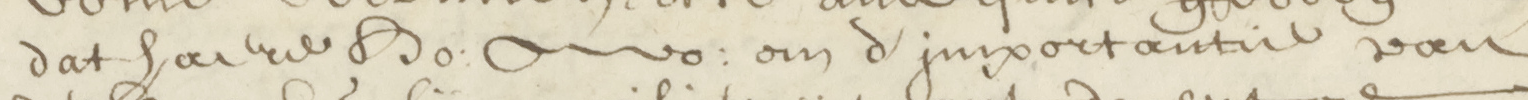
dat haere Ho:Mo: om d‛importantie van
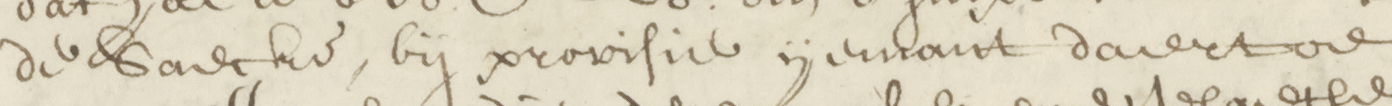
de Saecke, bij provisie ijemant daertoe
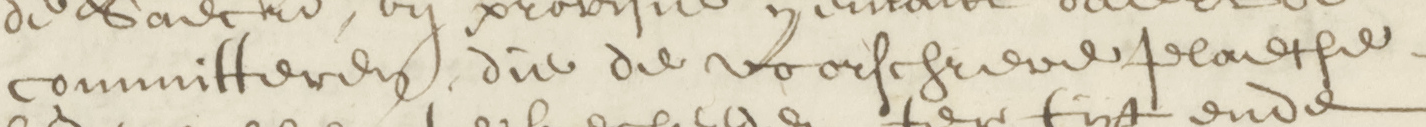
committeren, die de voorschreve plaetse
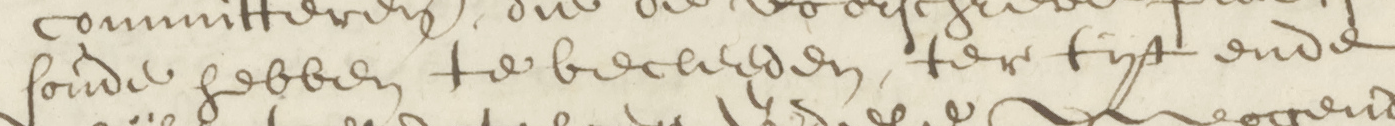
soude hebben te becleeden, ter tijt ende
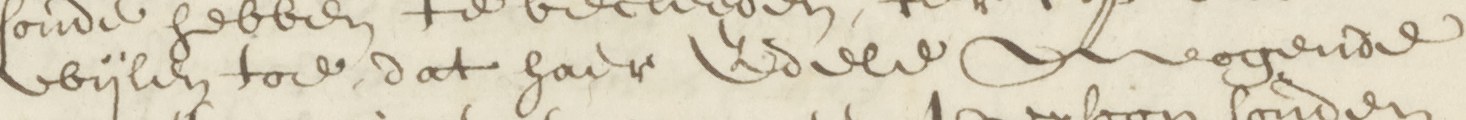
wijlen toe, dat haer Edele Mogende
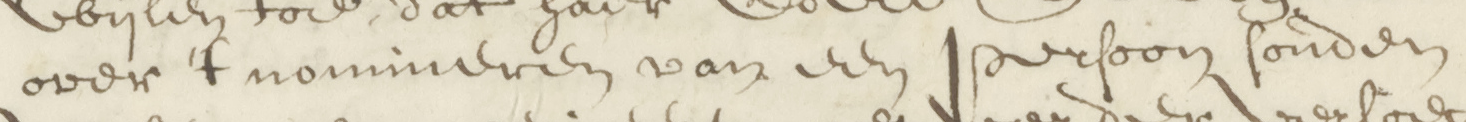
over ‛t nomineren van een persoon souden
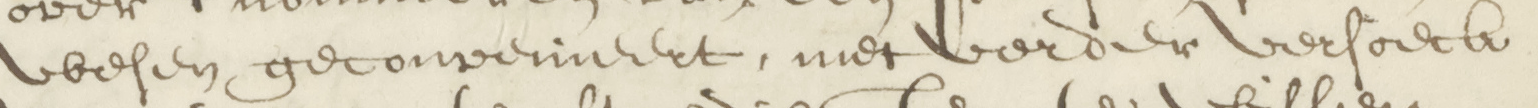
wesen geconvenieert, met verder versoeck
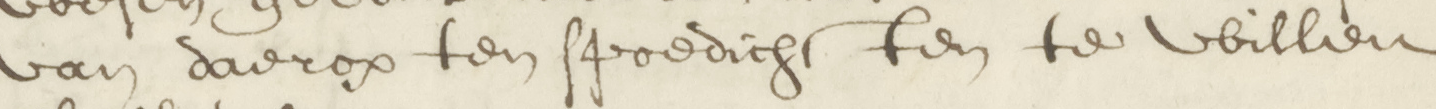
van daerop ten spoedichsten te willen
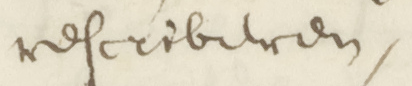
rescriberen.
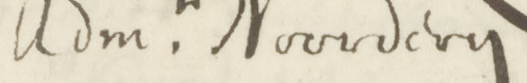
Admt. Noorderqr.
